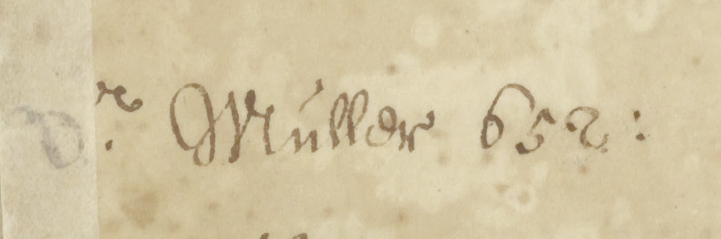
Dr. Muller 652:
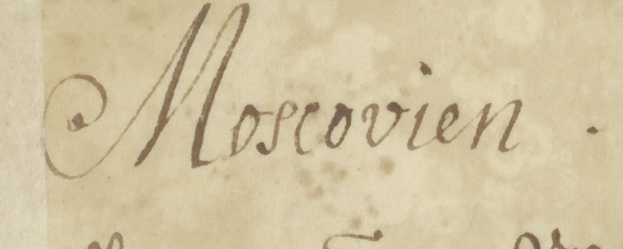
Moscovien.
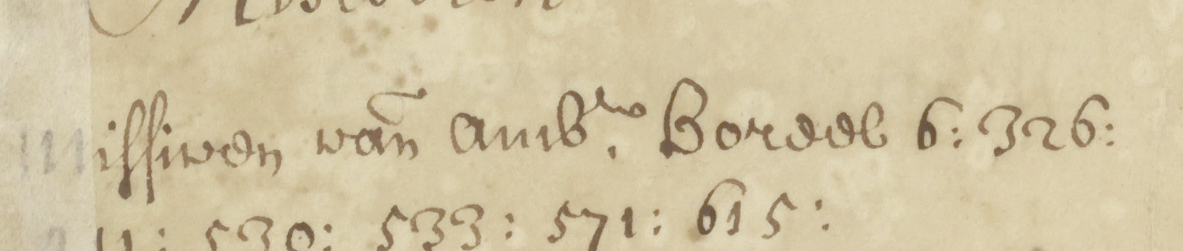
Missiven van Ambr. Boreel 6: 326:
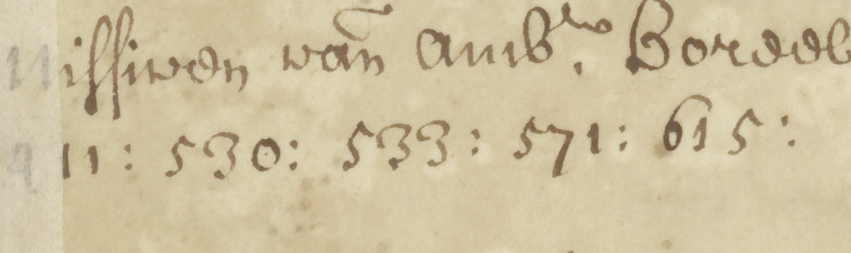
411: 530: 533: 571: 615:
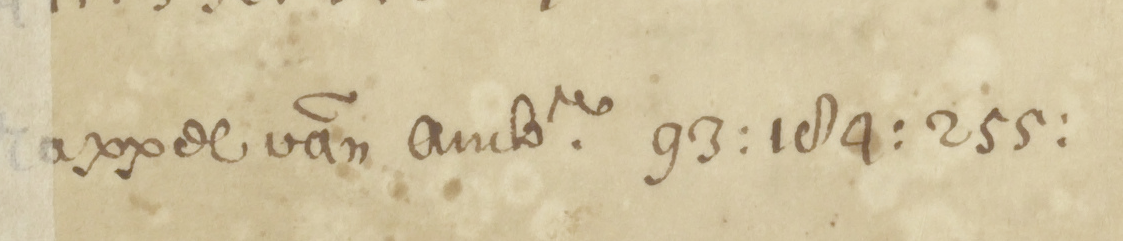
Rappel van Ambr. 93: 184: 255:
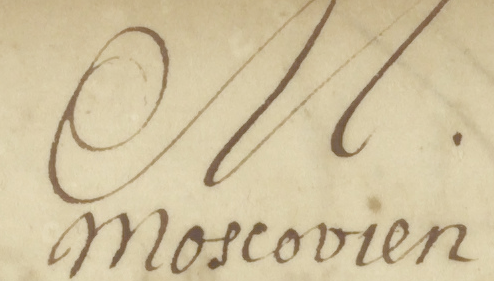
M.
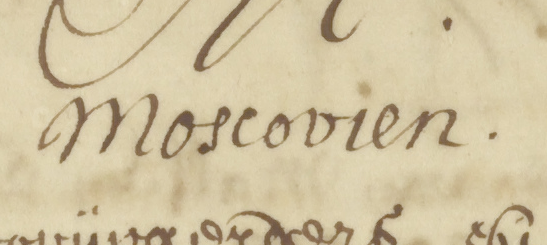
Moscovien.
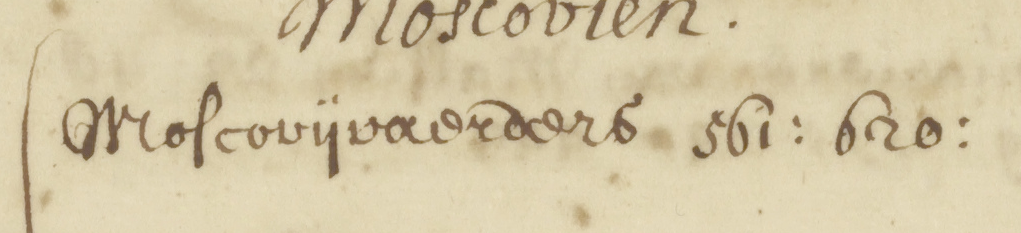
Moscovijvaerders 561: 620:
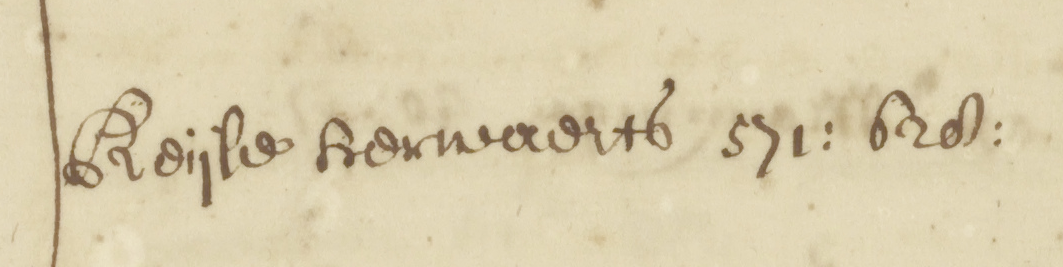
Reijse herwaerts 571: 628:
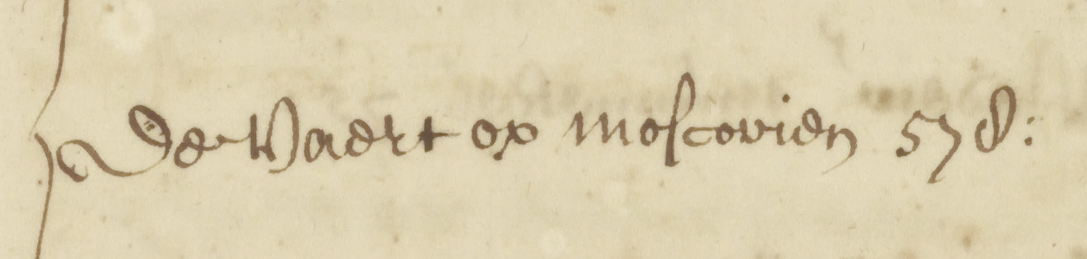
De Vaert op moscovien 578:
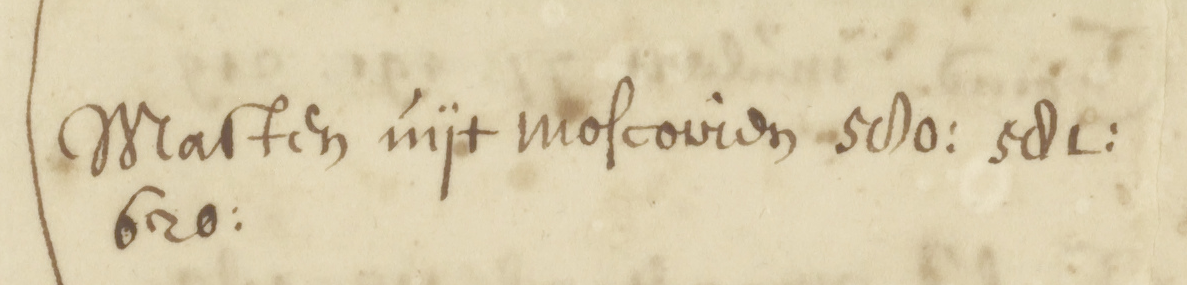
Masten uijt Moscovien 580: 581:
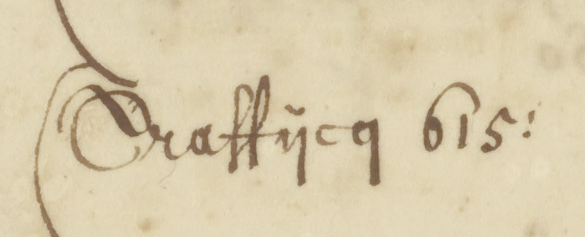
Traffijcq 615:
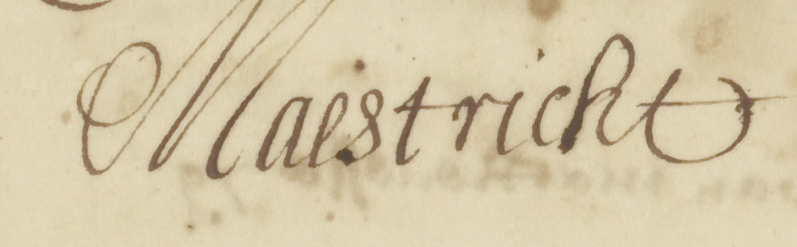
Maestricht.
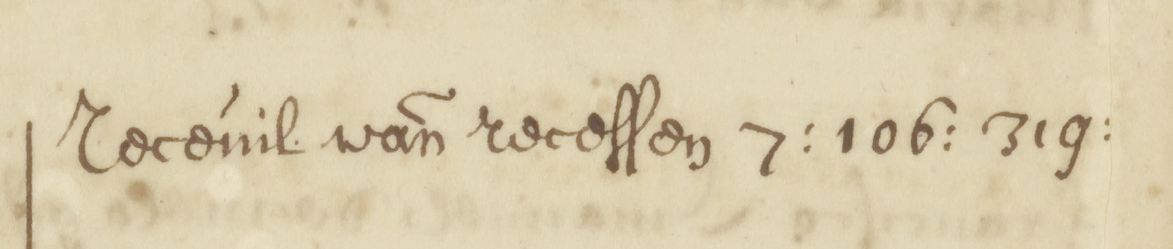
Receuil van recessen 7: 106: 319:
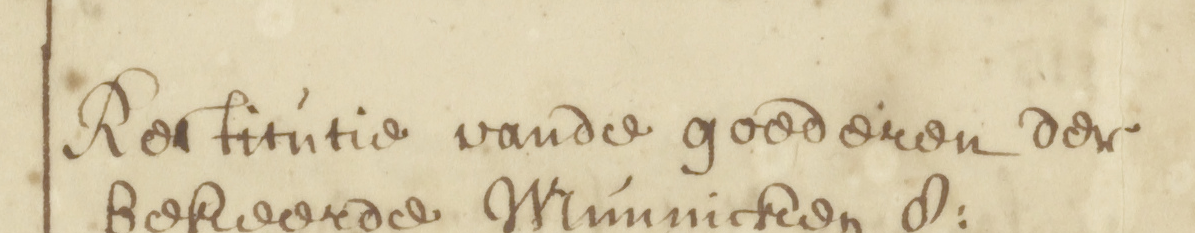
Restitutie vande goederen der
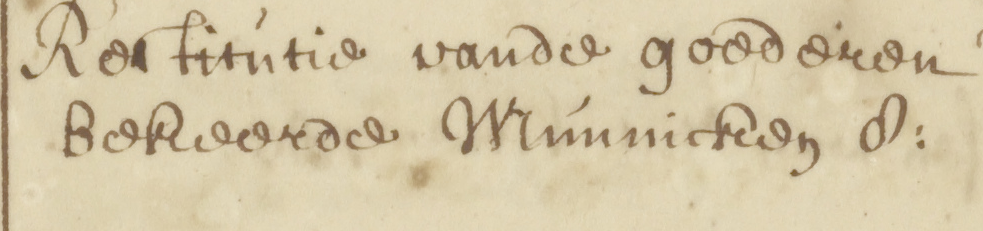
bekeerde Munnicken 8:
